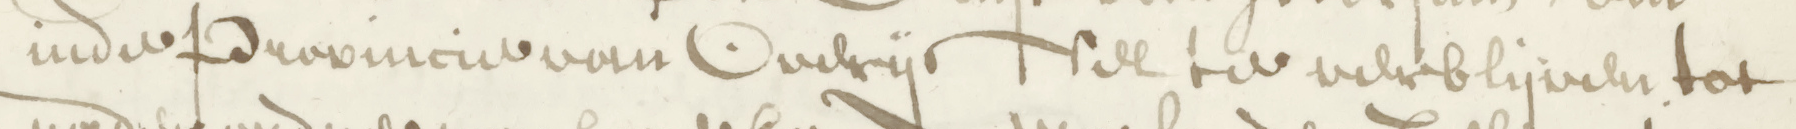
inde Provincie van Overijssel te verblijven tot
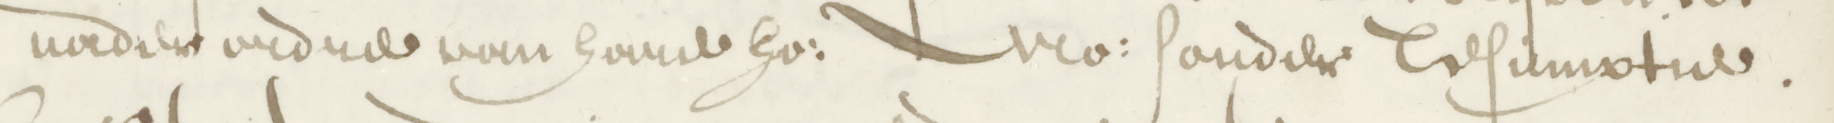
nader ordre van hare Ho:Mo: sonder resumptie.
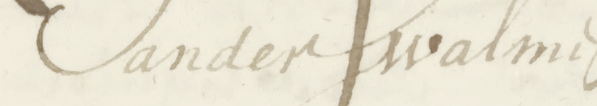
Vander Swalm
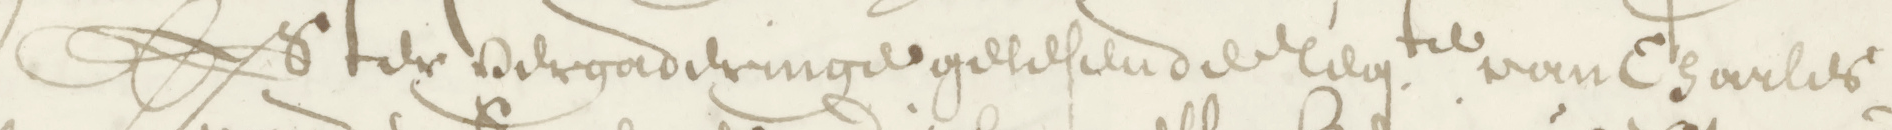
Is ter Vergaderinge gelesende reqte van Charles
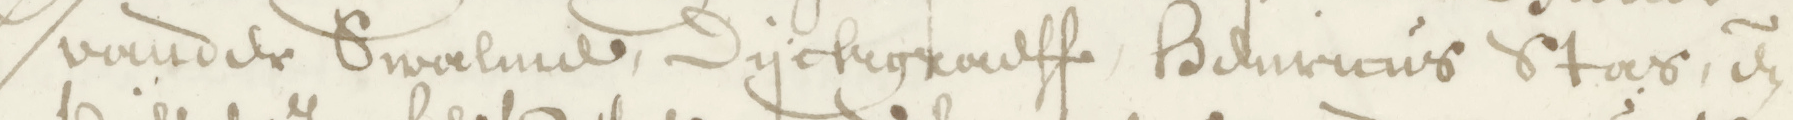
vander Swalme, Dijckgraeff, Henricus Stas, en
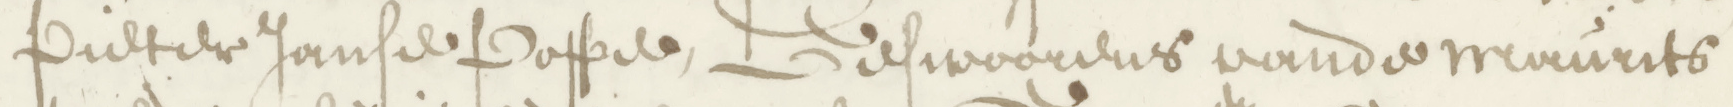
Pieter Janse Poppe, Geswoorens vande Maurits
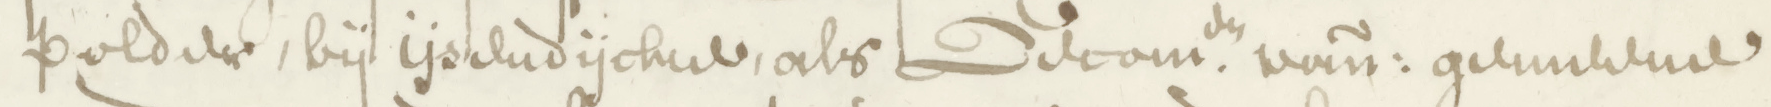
polder, bij IJsendijcke, als Gecomden van gemeene
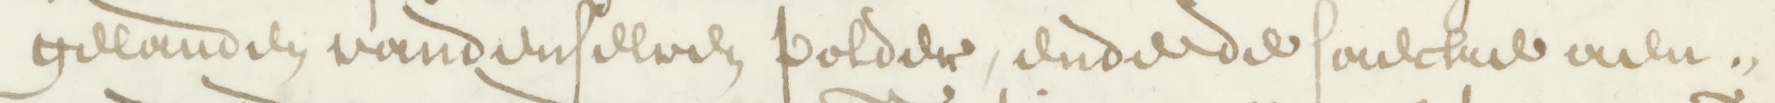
gelanden vandenselven polder, ende de saecke aen„
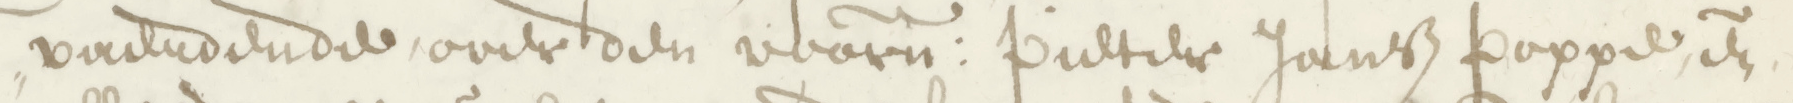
vaerdende over den voorn. Pieter Janesz. Poppe, en
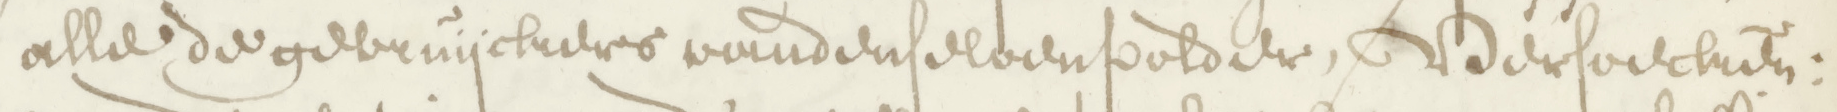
alle de gebruijckers vandenselven polder. Versoecken
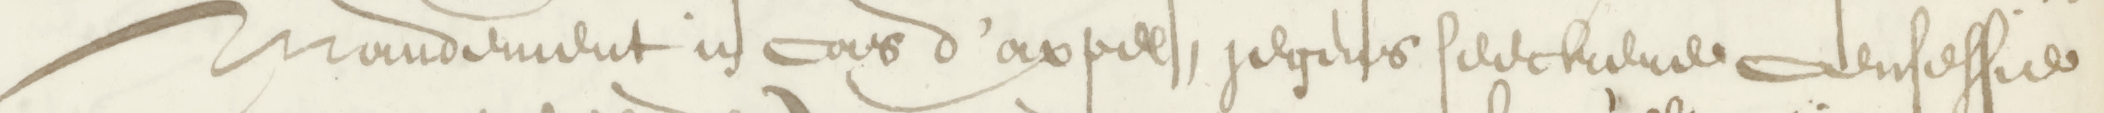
Mandement in cas d'appel, jegens seeckere consessie
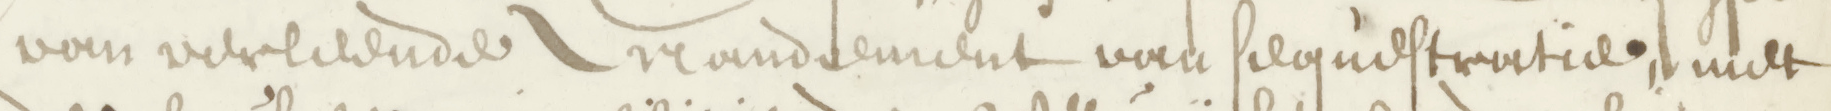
van verleende Mandement van sequestratie, met
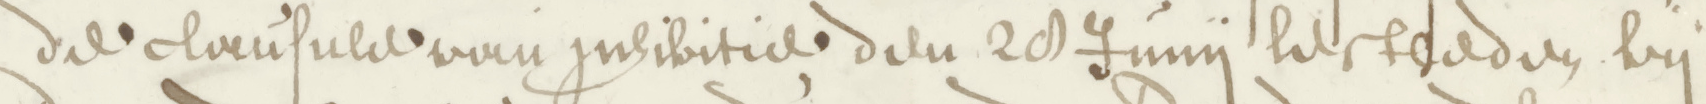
de clausule van inhibitie den 28 Junij lestleden bij
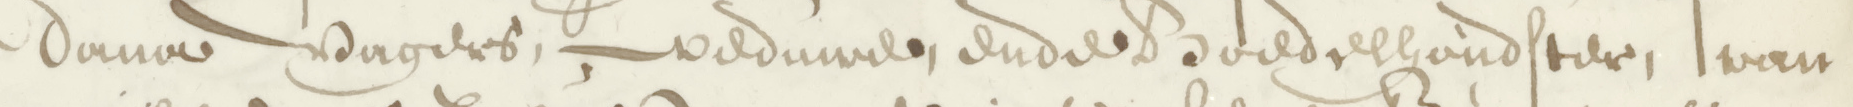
Dana Vagers, Weduwe ende Boedelhoudster van
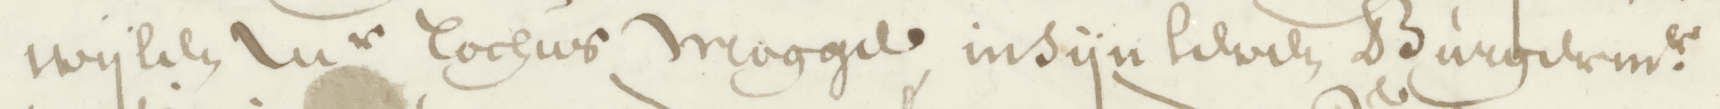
wijlen mr rochus Mogge in sijn leven Burgermr.
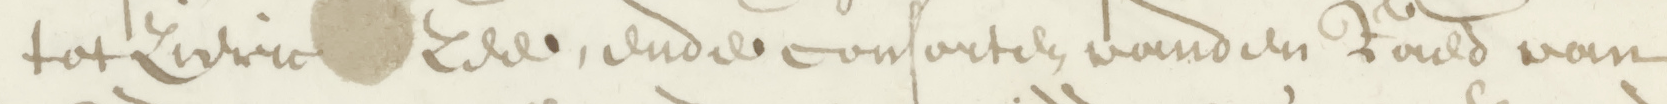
tot Zieric zee, ende consorten vanden Raed van
